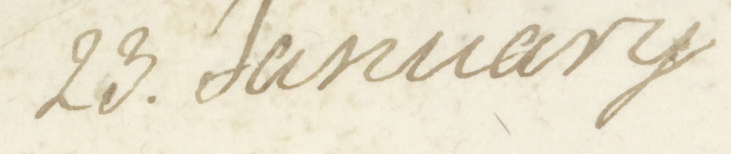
23. Januarij.
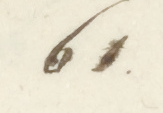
61
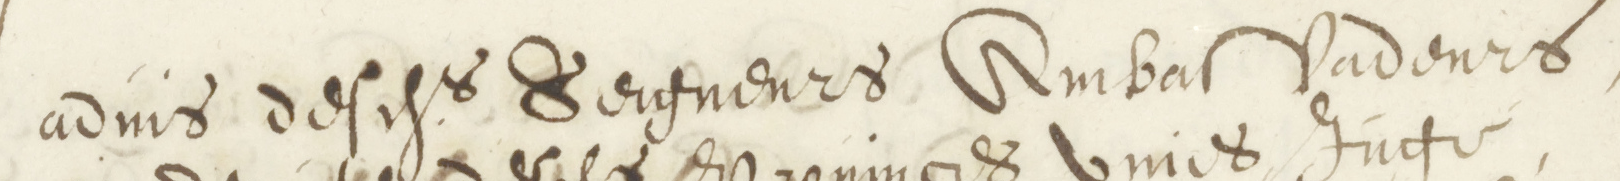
aduis desds. Seigneurs Ambassadeurs,
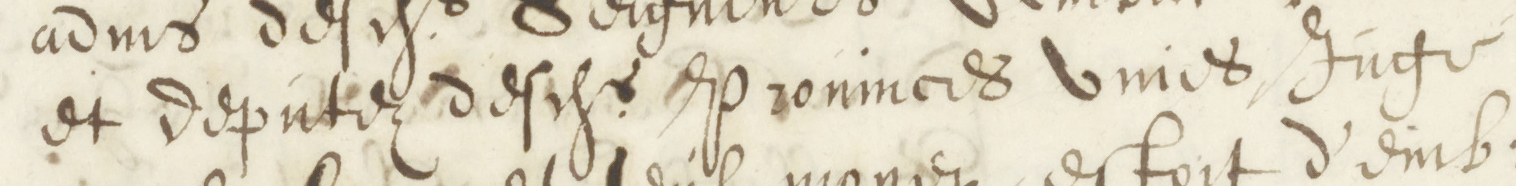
et deputez desds. Prouinces viues Juge,
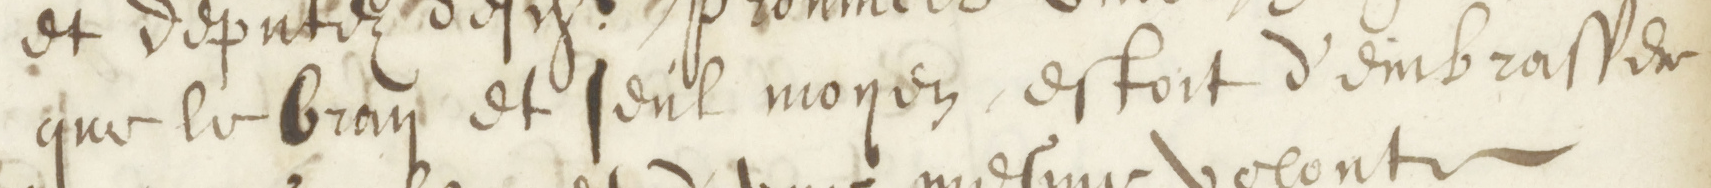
que le vray et seul moyen estoit d‛embrasser
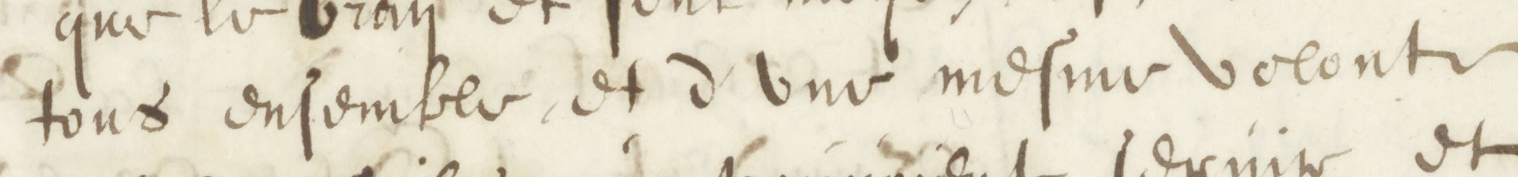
tous ensemble, et d‛vne mesme volonte
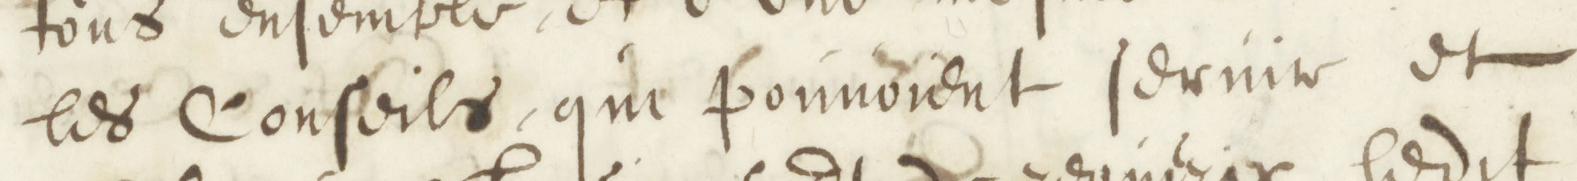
les Conseils, qui pouuoient seruir et
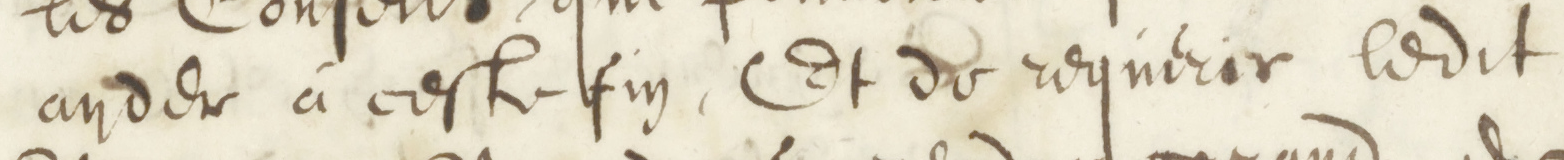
ayder á ceste fin, Et de requerir ledit
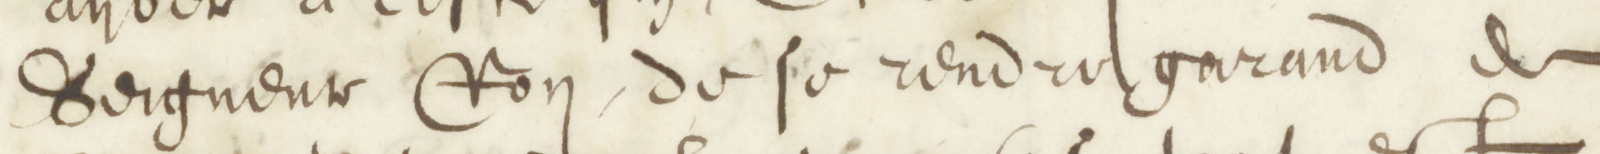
Seigneur Roy, de se rendre garand de
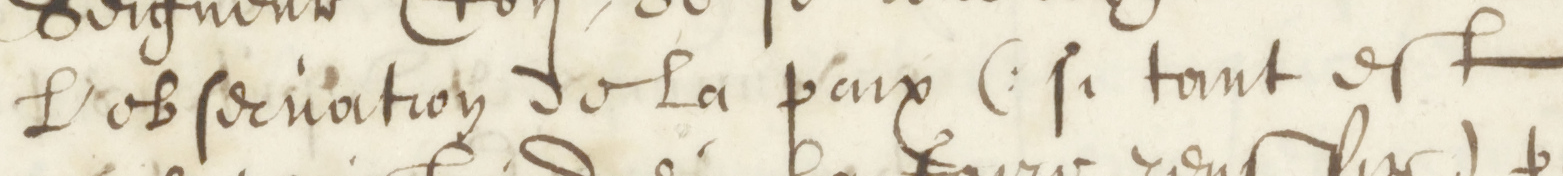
L‛obseruation de la paix (:si tant est
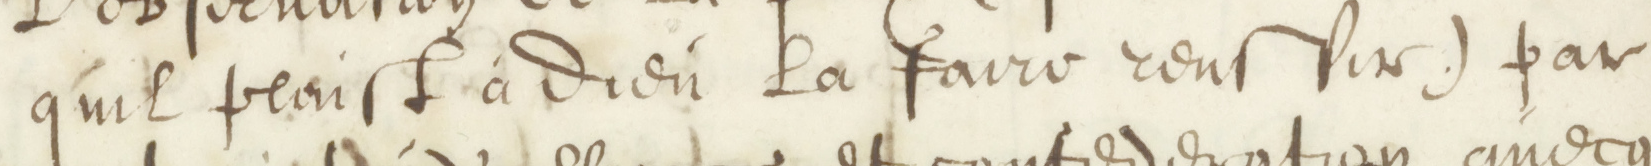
quil plaist a Dieu la faire reussir.) par
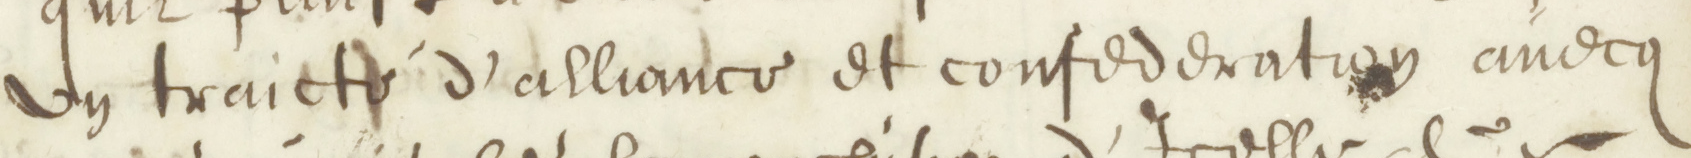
un traicté d'alliance et confederation auecq
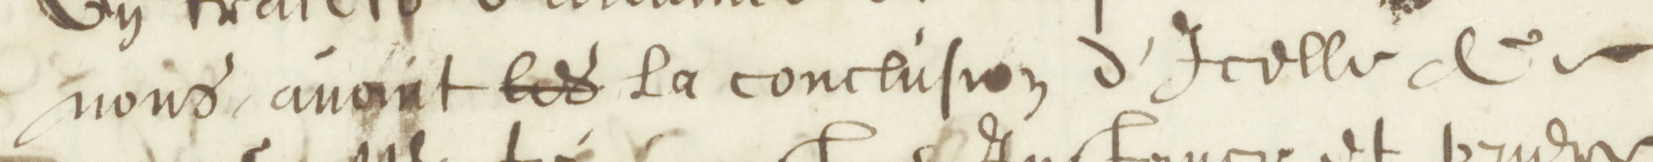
nous, auant les la conclusion d'Icelle ce
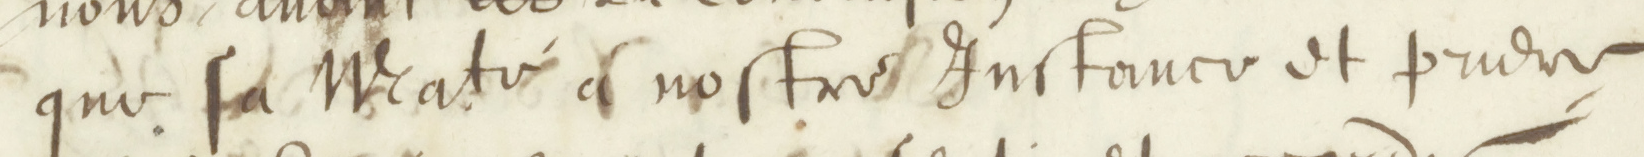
que sa Maté a nostre Instance et priere
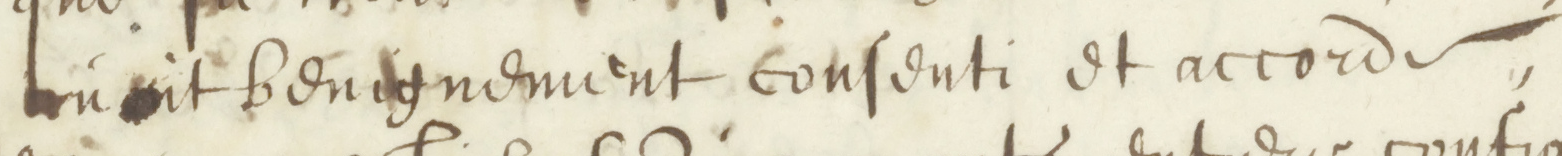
xu xit benignement consenti et accordé
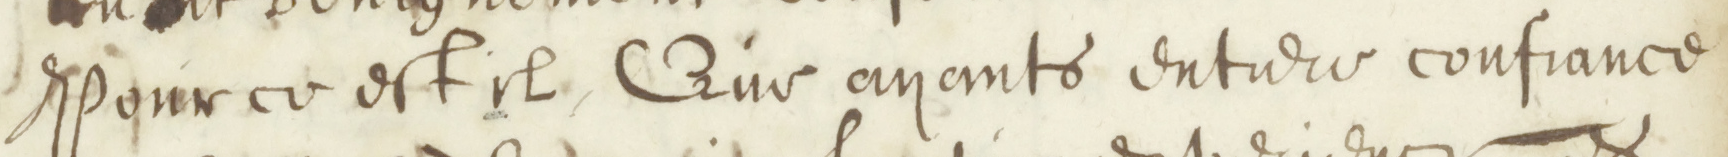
Pour ce est il, Que ayants entiere confiance
